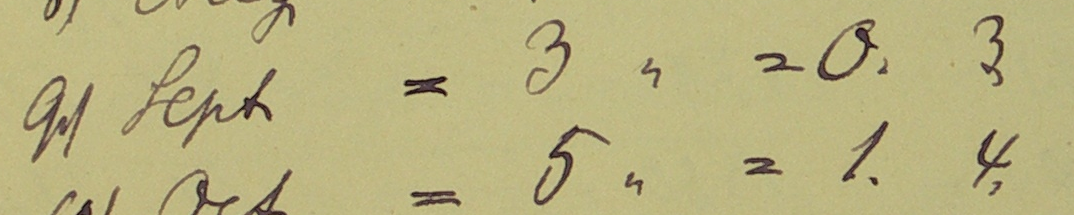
9) Sept. = 3 mal = 0 3
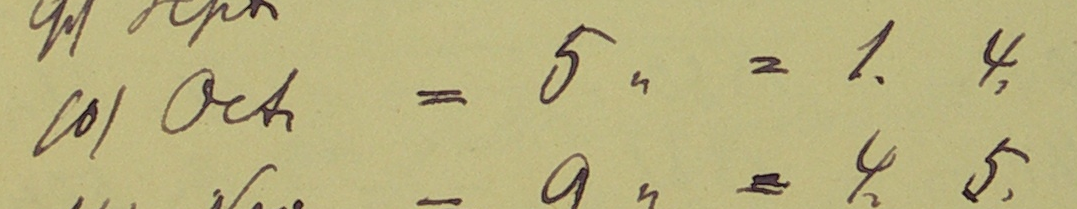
10.) Oct. = 5 mal = 1 4
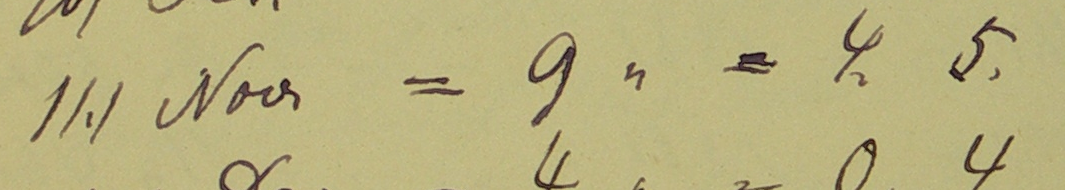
11.) Nov. = 9 mal = 4 5
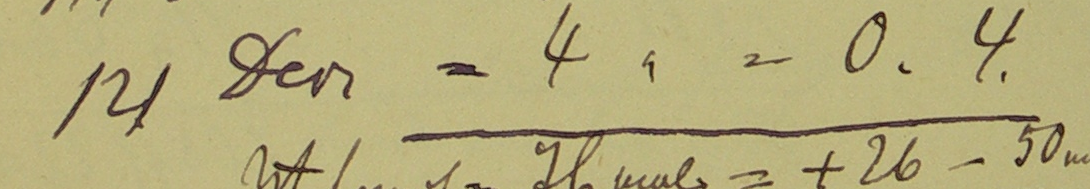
12.) Dec. = 4 mal = 0 4
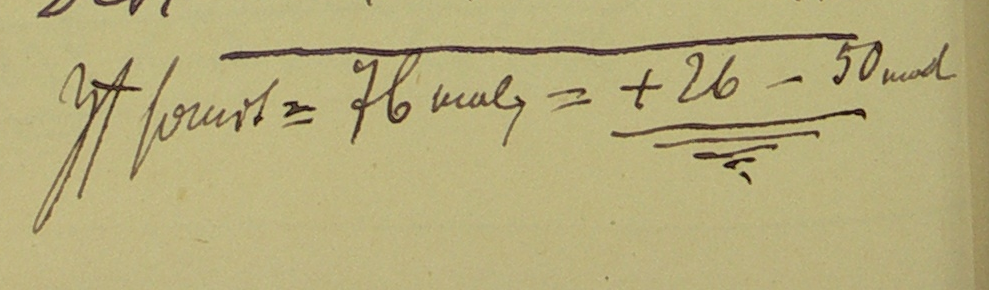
Zusammen somit = 76 mal = +26 -50 mal
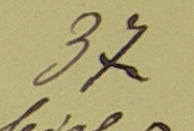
37
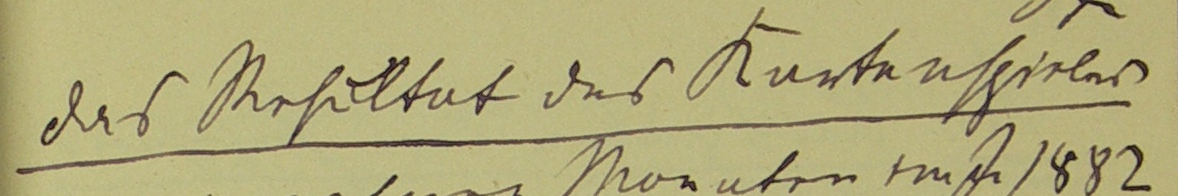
Das Resultat des Kartenspiels
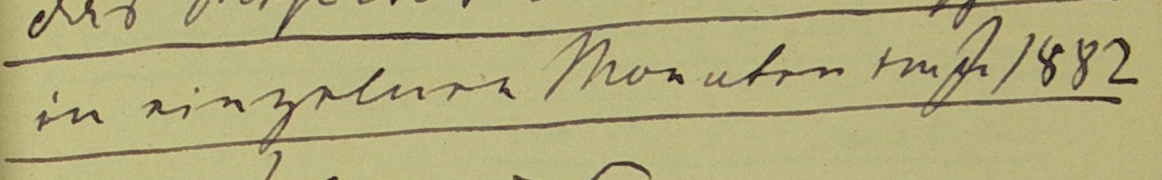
in einzelnen Monaten im Jahre 1882
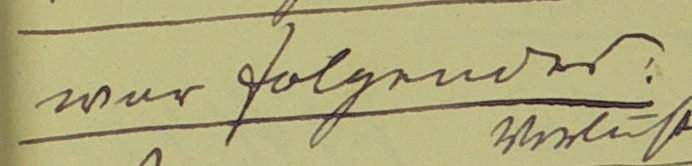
war folgendes:
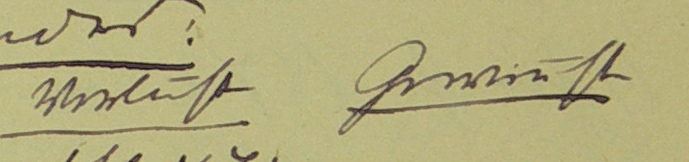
Verlust Gewinst
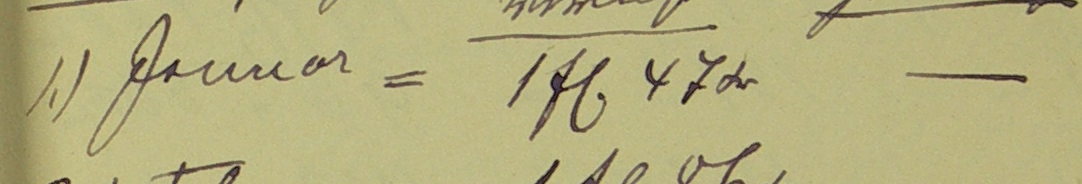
1.) Januar = 1 fl 47 tr --
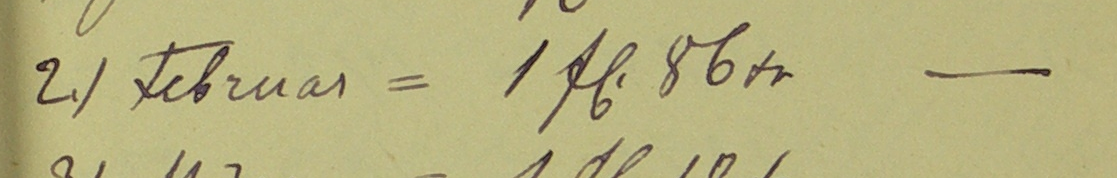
2.) Februar = 1 * 86 * --
